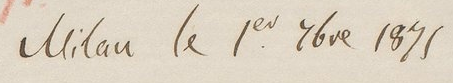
Milan le 1er 7bre 1871
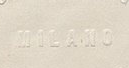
Monsieur
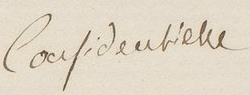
Confidentielle
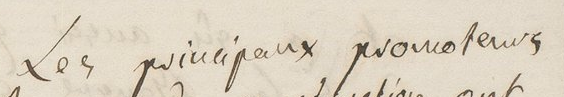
Les principaux promoteurs
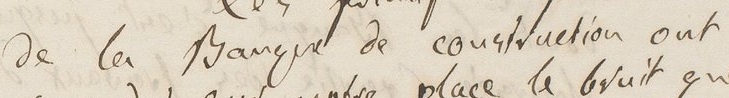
de la Banque de construction ont
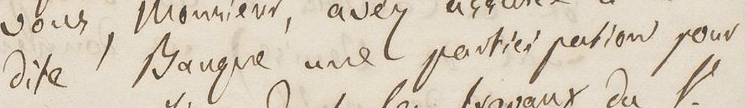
dite Banque une participation pour
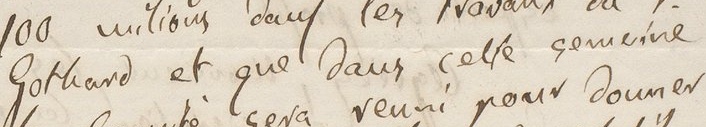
Gothard et que dans cette semaine
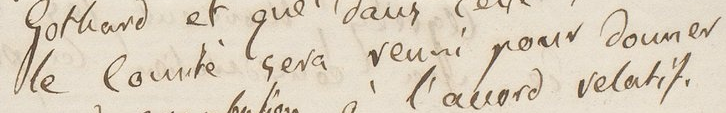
le Comité sera reuni pour donner
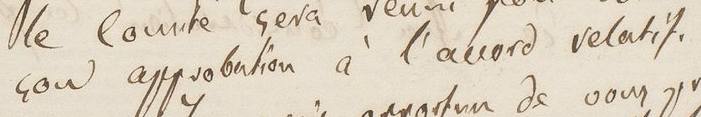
son approbation à l'accord relatif.
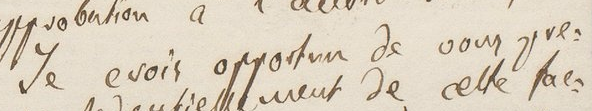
Je crois opportun de vous pre-
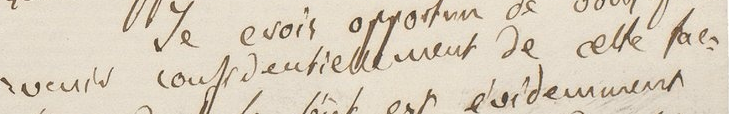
venir confidentiellement de cette tac-
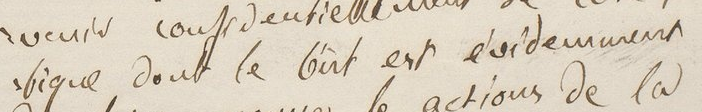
tique dont le bût est évidemment
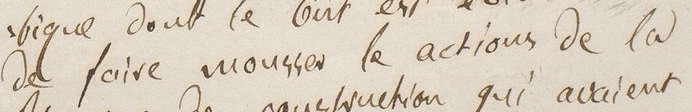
de faire mousser le actions de la
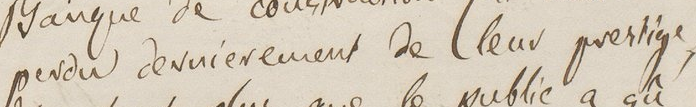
perdu dernierement de leur prestige,
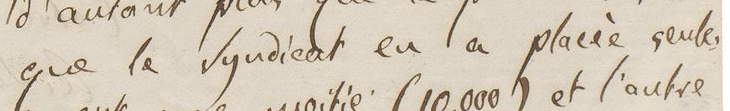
que le Syndicat en a placée seule-
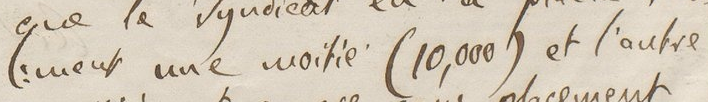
ment une moitié (10,000) et l'autre
